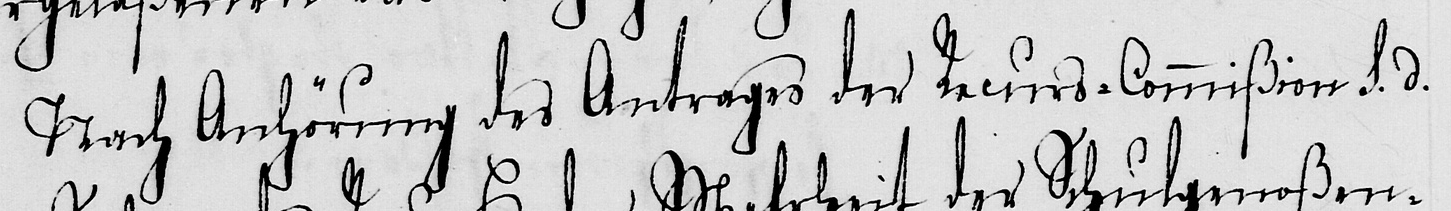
Nach Anhörung des Antrages der Recurs-Commißion S.
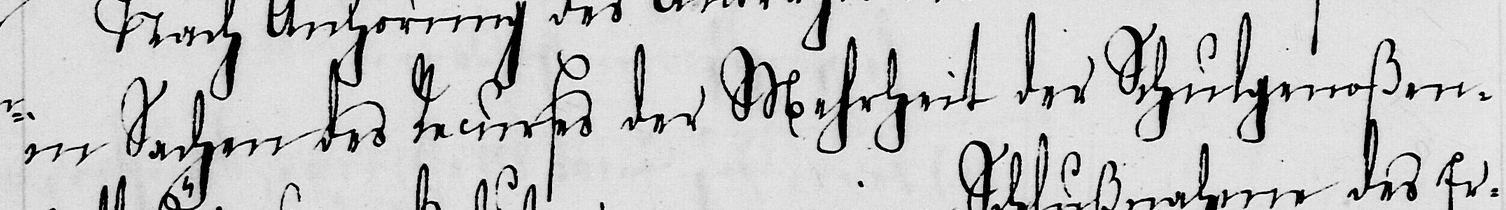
in Sachen des Recurses der Mehrheit der Schulgenoßensc¬
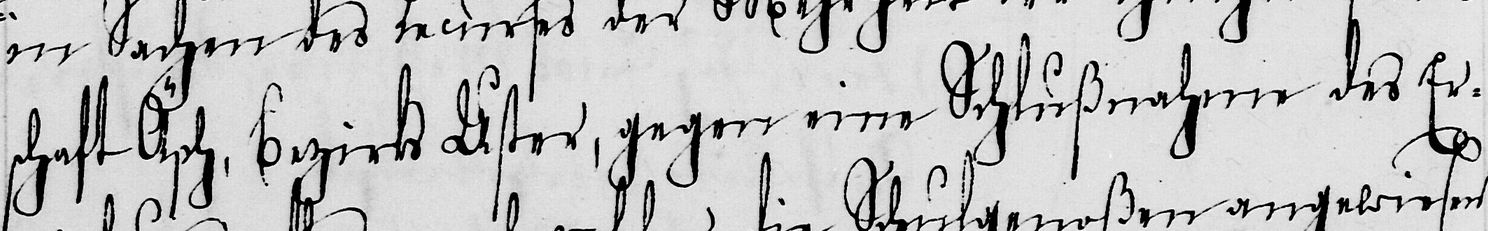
haft Äsch, Bezirk Uster, gegen eine Schlußnahme des Er¬
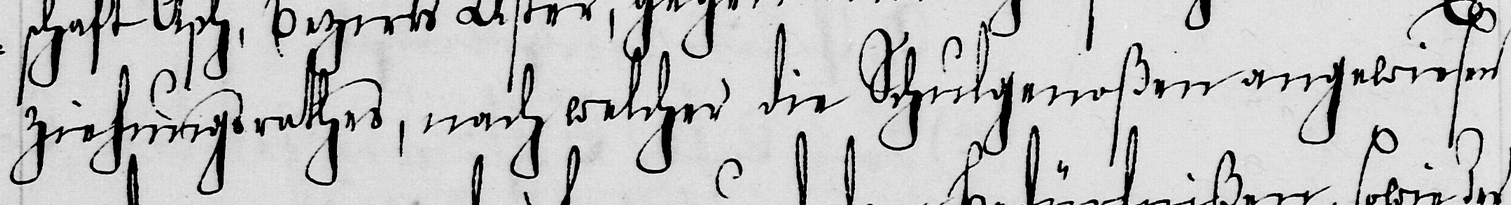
ziehungsrathes, nach welcher die Schulgenoßen angewiesen
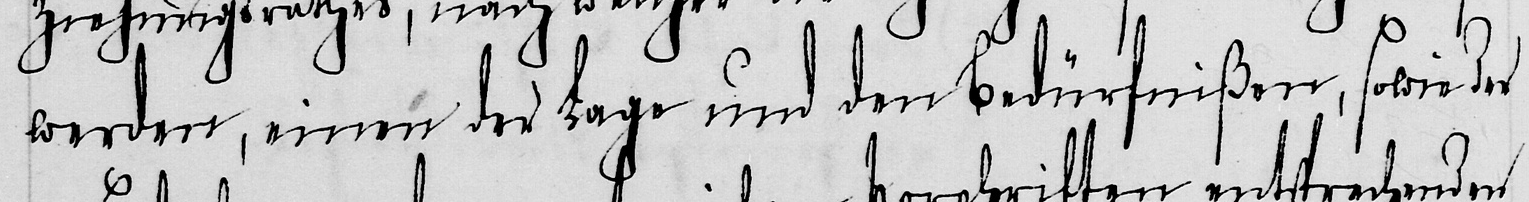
werden, einen der Lage und den Bedürfnißen, sowie der
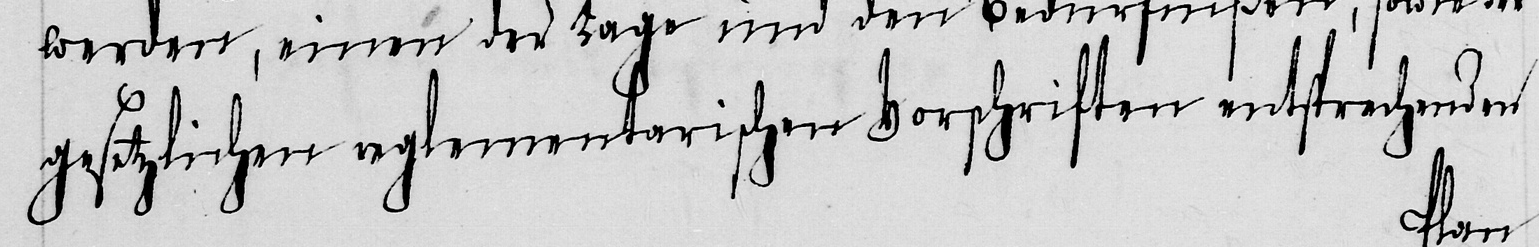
gesetzlichen reglementarischen Vorschriften entsprechenden
